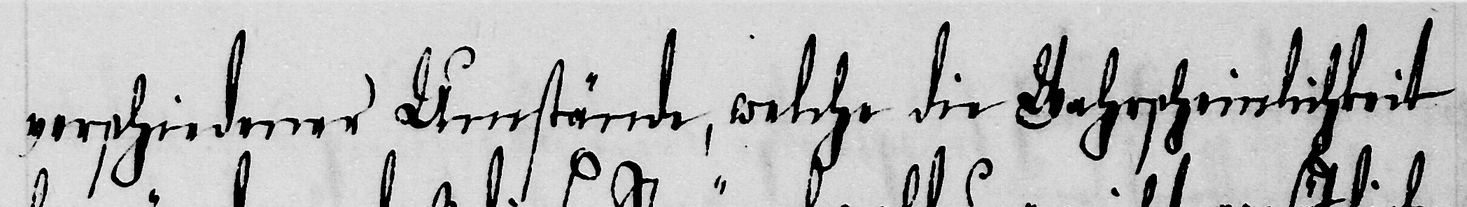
verschiedener Umstände, welche die Wahrscheinlichkeit
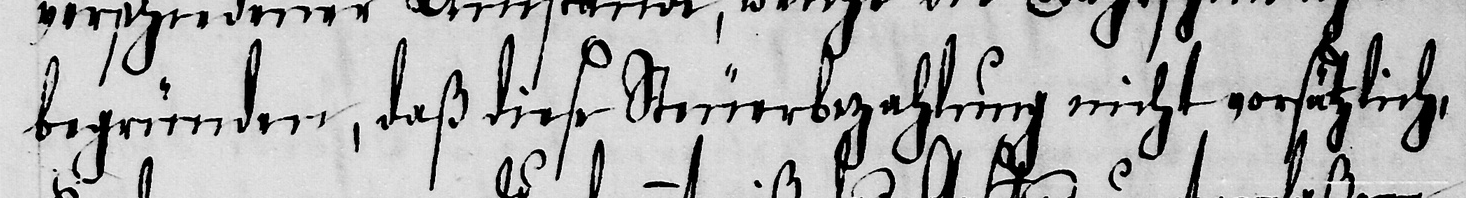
begründen, daß diese Steuerbezahlung nicht vorsätzlich,
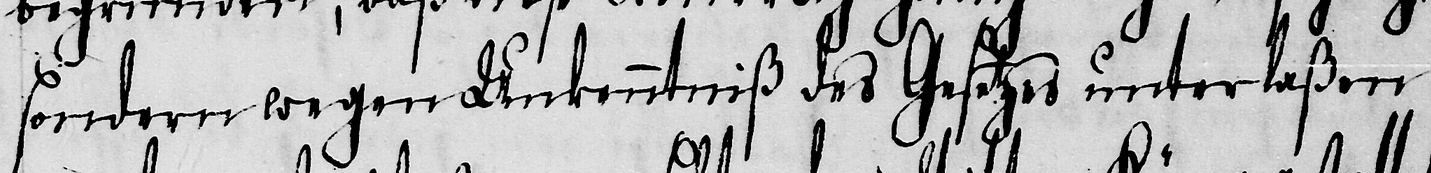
sondern wegen Unkenntniß des Gesetzes unterlaßen
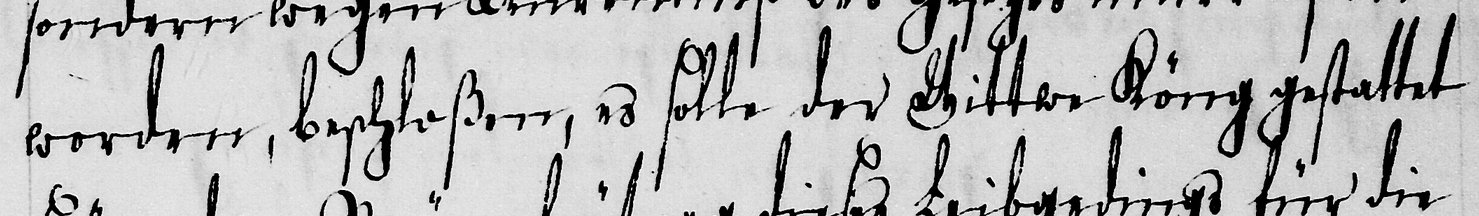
worden, beschloßen, es solle der Wittwe Köng gesta¬
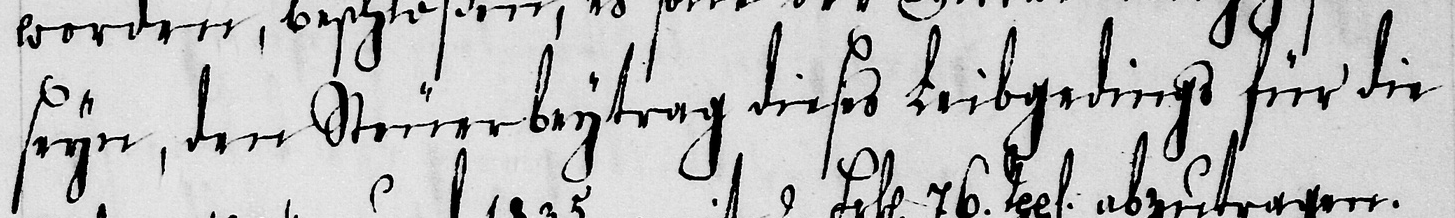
seyn, den Steuerbeytrag dieses Leibgedings für die
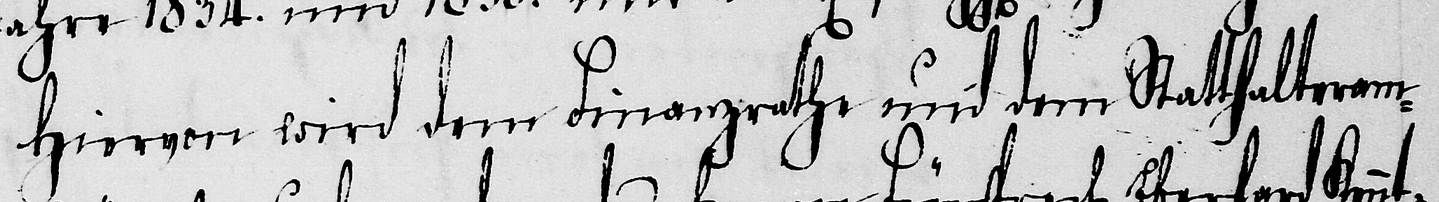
Hiervon wird dem Finanzrathe und dem Statthaltera¬
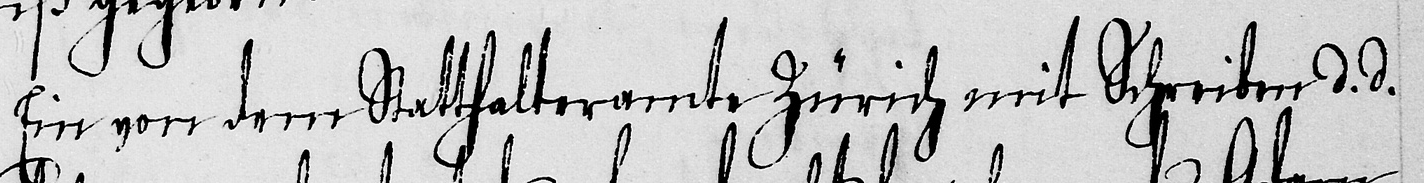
Ein von dem Statthalteramte Zürich mit Schreiben d. d.
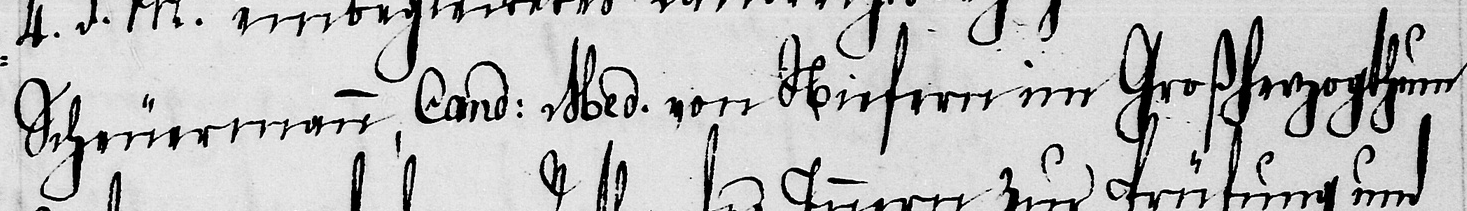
Scheuermann, Cand: Med. von Niefern im Großherzogthum
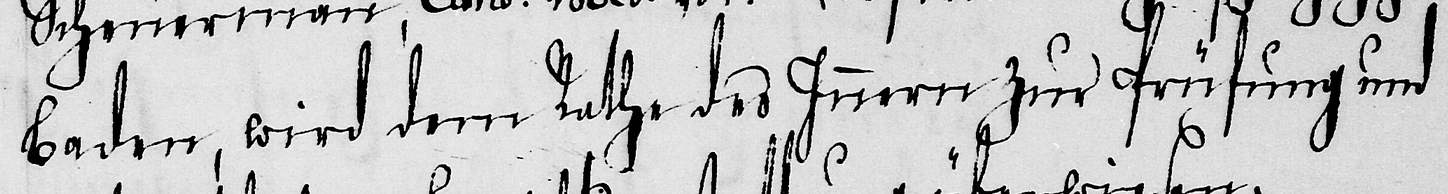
Baden, wird dem Rathe des Innern zur Prüfung und
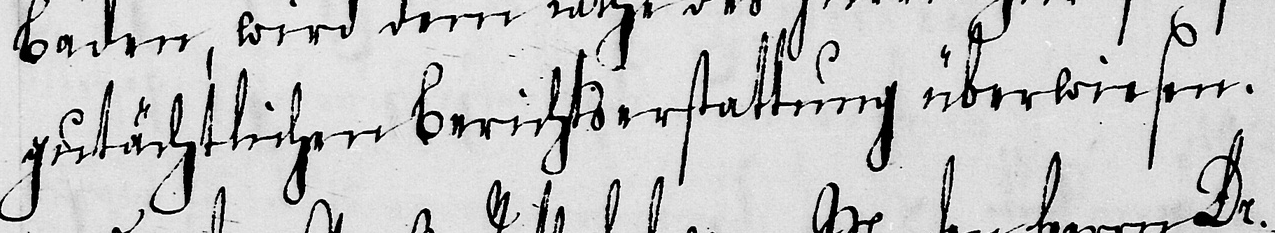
gutächtlichen Berichtserstattung überwiesen.
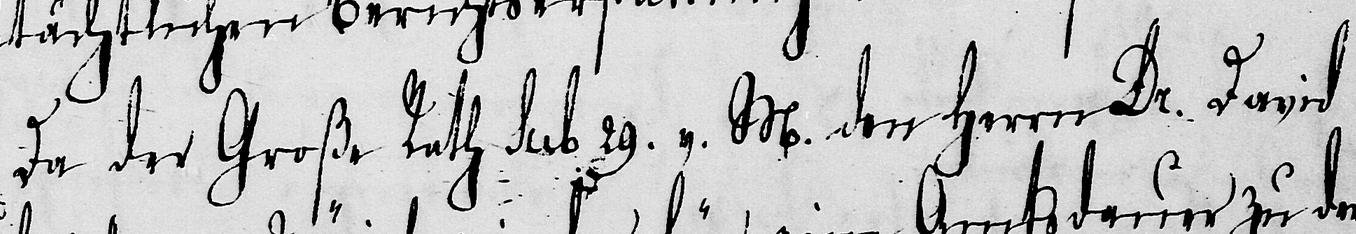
Da der Große Rath sub. 29. v. M. den Herrn Dr. Davi¬
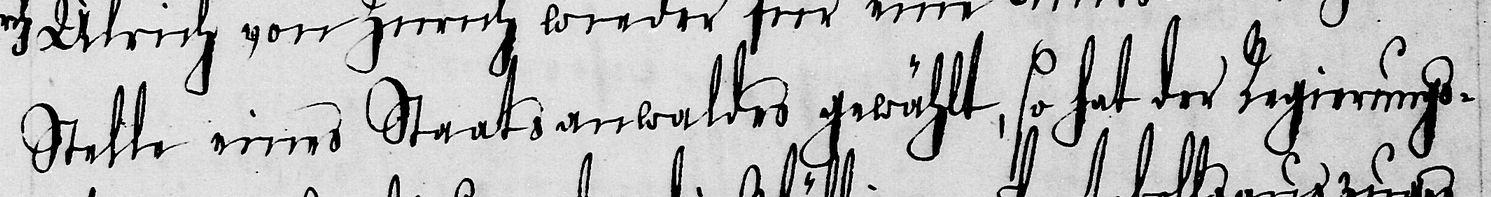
Stelle eines Staatsanwaldes gewählt, so hat der Regierungs¬
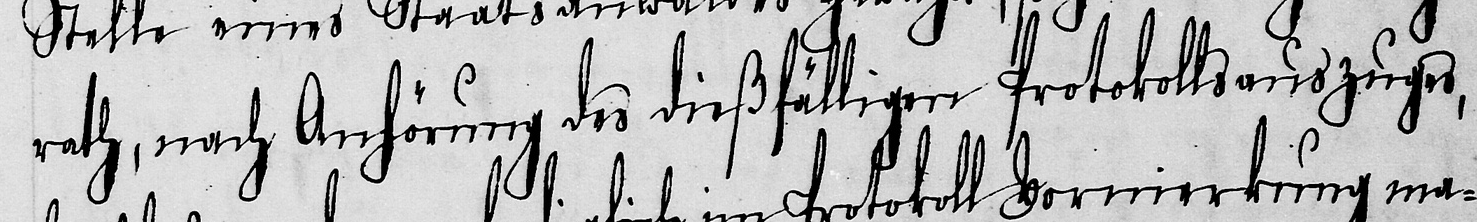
rath, nach Anhörung des dießfälligen Protokollsauszuges,
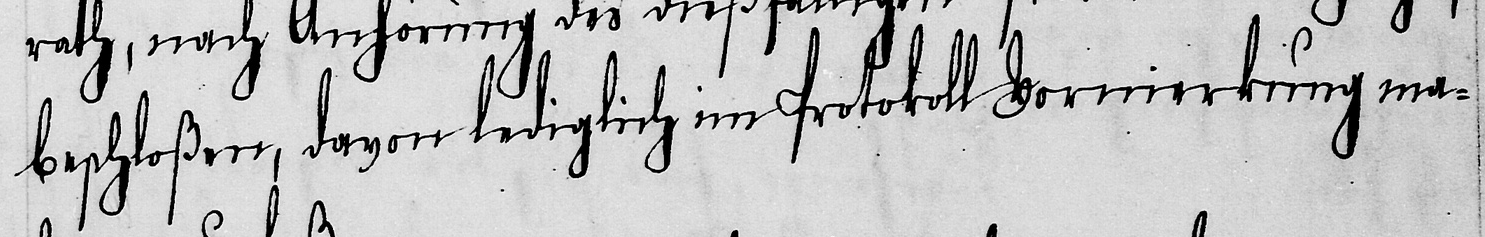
beschloßen, davon lediglich im Protokoll Vormerkung ma¬
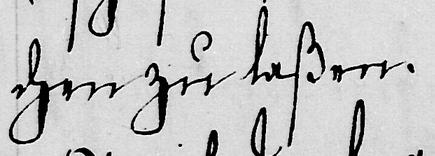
chen zu laßen.
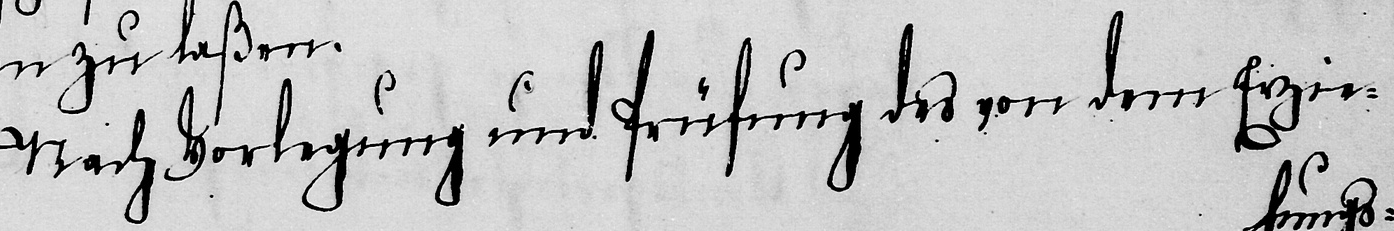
Nach Vorlegung und Prüfung des von dem Erzie-
